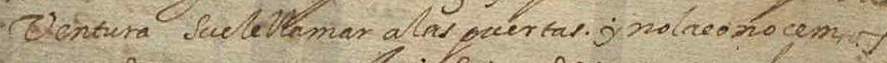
Ventura suele llamar a las puertas y no la conocemos
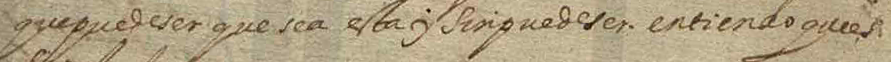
que puede ser que sea esta y sin puede ser entiendo que si
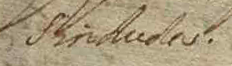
sin duda.
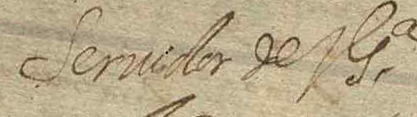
Seruidor de V S.a
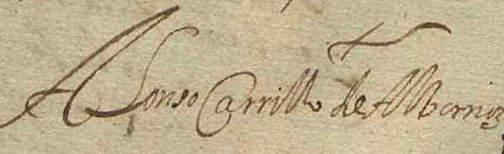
ALonso Carrillo de Albornoz
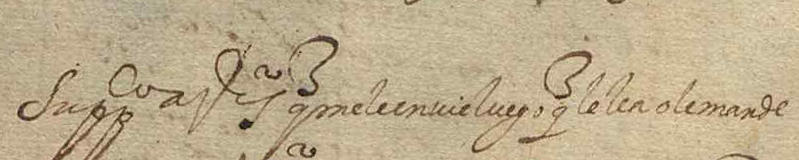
Suppco a Va S q̄ me le enuie luego q̄ le lea o le mande
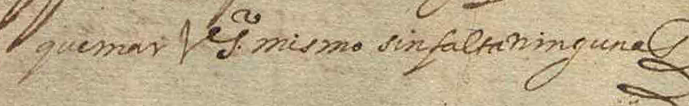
quemar V S.a mismo sin falta ninguna
